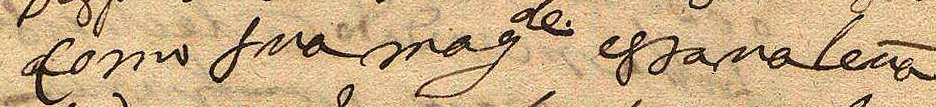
Como sua magde estaua leuā
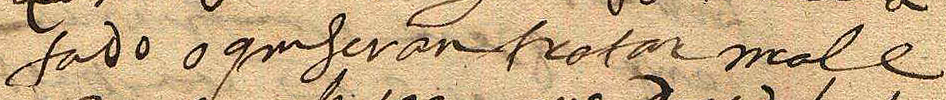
tado o quiseram tratar mal e
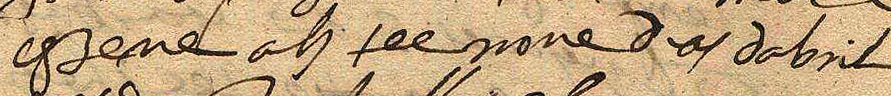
esteue alj tee noue dias dabriL
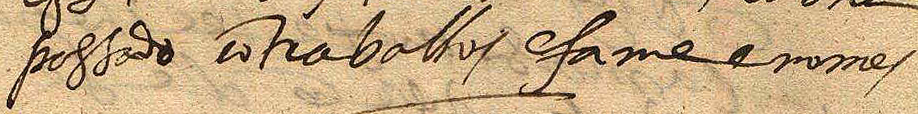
passado cō trabalhos e fame e no mes
